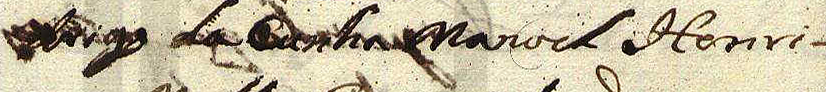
rigo da Cunha Manoel Henri
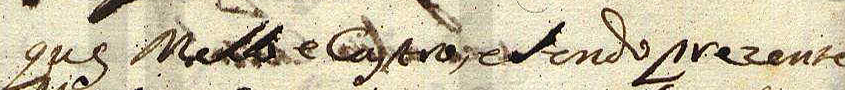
ques Mello e Castro, e sendo prezente
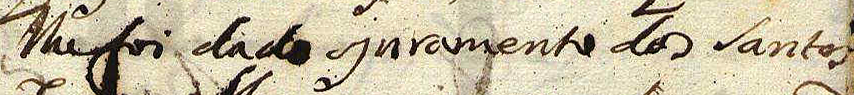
lhe foi dado o juramento dos santos
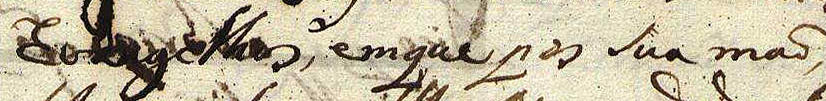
Eva_gelhos, em que pos sua maõ,
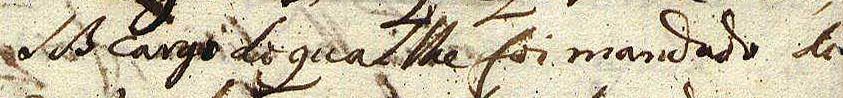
sob cargo do qual lhe foi mandado di
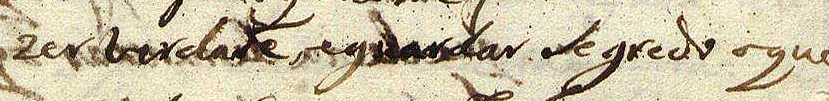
zer verdade, e guardar segredo o que
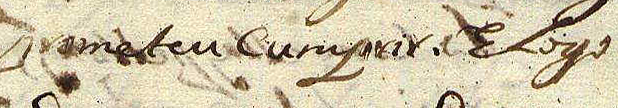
prometeu cumprir. E Logo
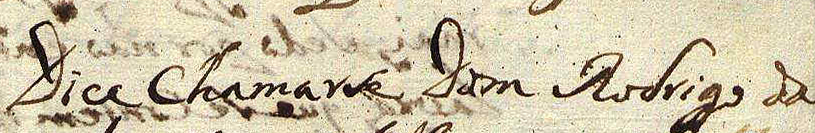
Dice chamarse, Dom Rodrigo da
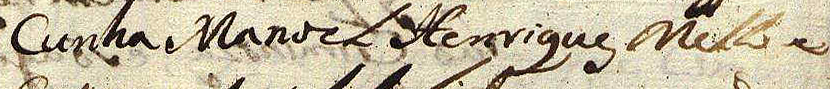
Cunha Manoel Henrique Mello e
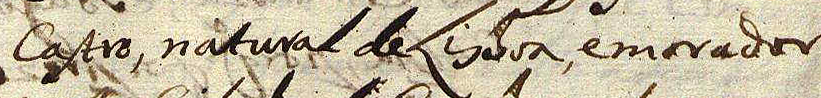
Castro, natural de Lisboa, e morador
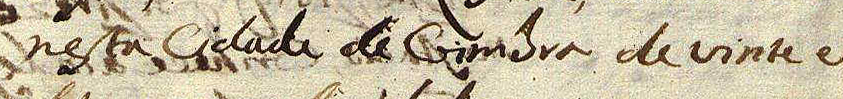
nesta Cidade de Coimbra de vinte e
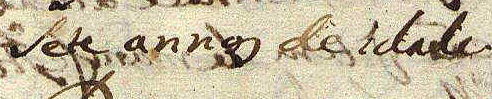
sete annos de idade
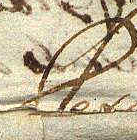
Per
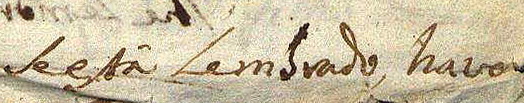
se está Lembrado, haver
